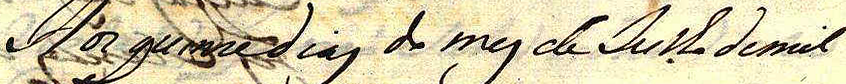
Aos quinze dias do mes de Iulho de mil
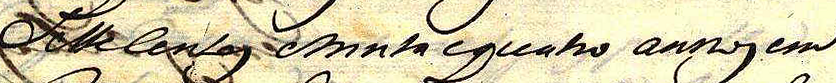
settecentos e trinta e quatro annos em
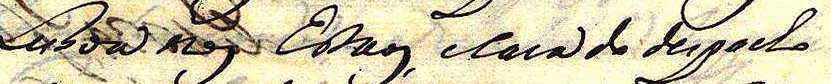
Lisboa nos Estaos, e caza do despacho
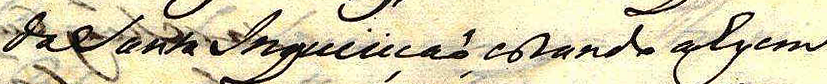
da santa Inquiziçaõ, estando ahy em
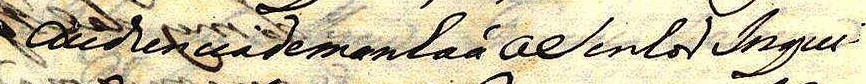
audiencia de manhaã o senhor Inqui
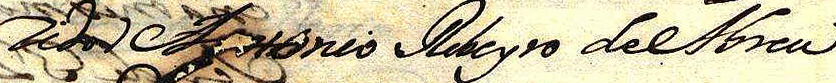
Zidor A_tonio Ribeyro de Abreu
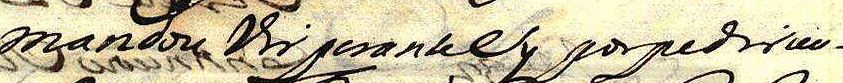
mandou Vir perante sy por pedir au
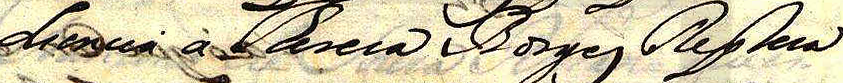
diencia a Thereza Borges Re pReza
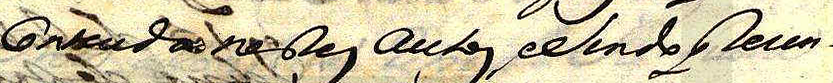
conteuda nestes autos, e sendo pRezen
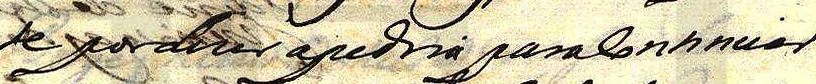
te por dizer a pedira para continuar
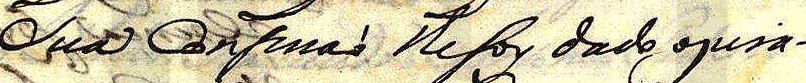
sua Confissaõ lhe foy dado o jura
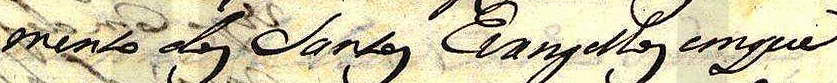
mento dos santos Evangelhos em que
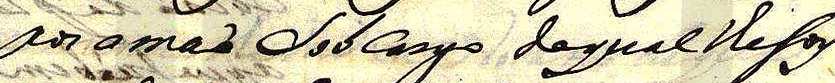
pos a maõ sob cargo do qual lhe foy
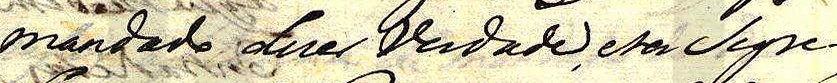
mandado dizer Verdade, e ter segre
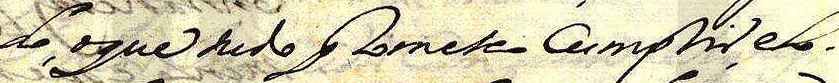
do, o que tudo pRometeo Cumprir, e lo
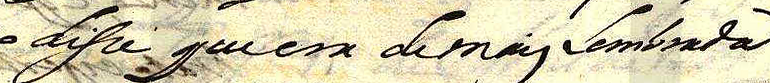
go disse que era de mais Lembrada
